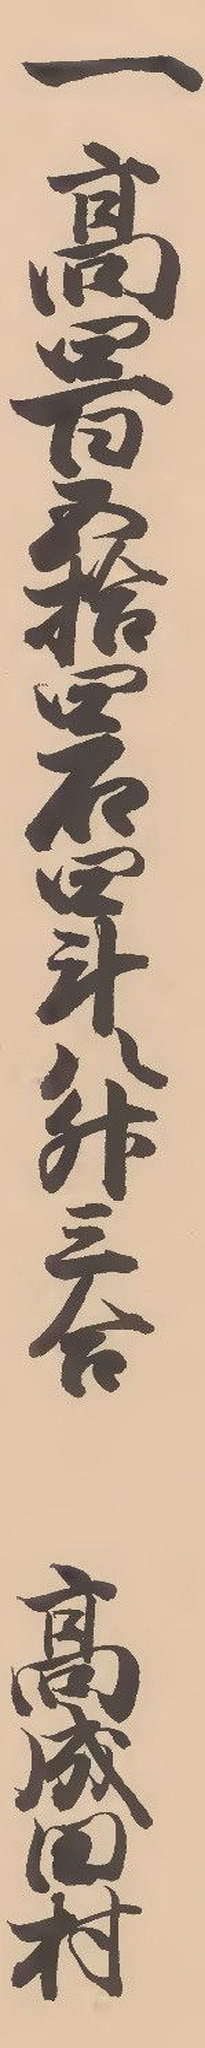一高四百五拾四石四斗八升三合高成田村
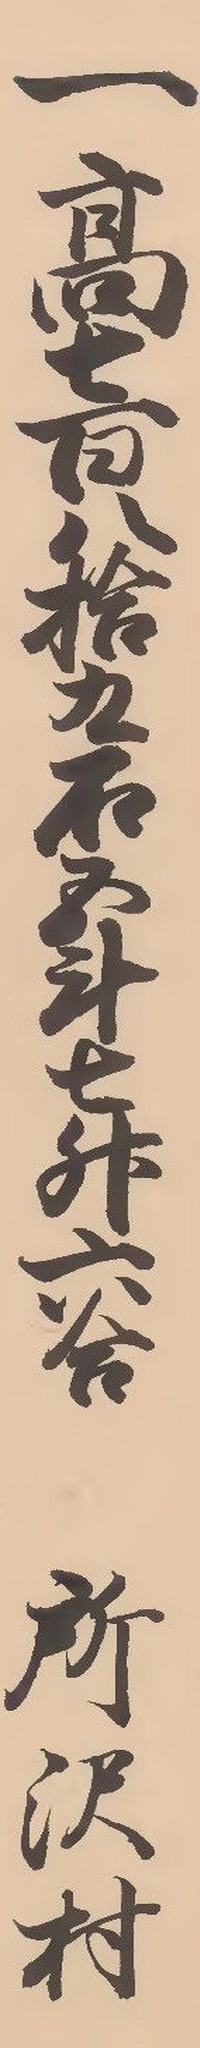一高七百八拾九石五斗七升六合所沢村
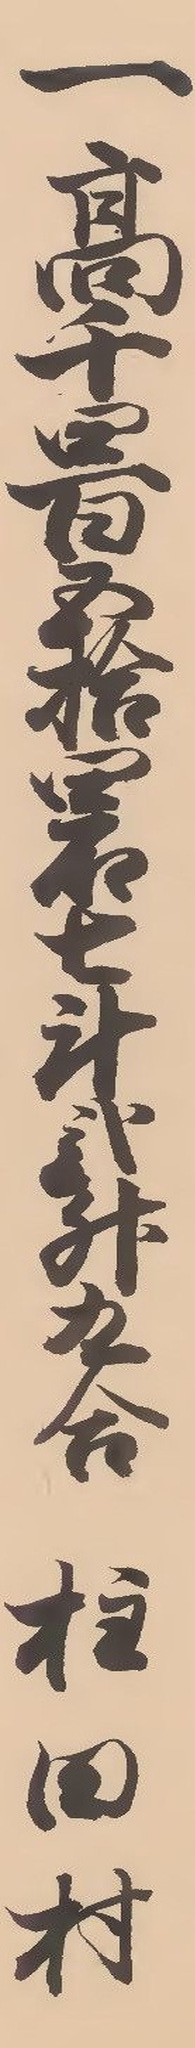一高千四百五拾四石七斗弐升九合柱田村
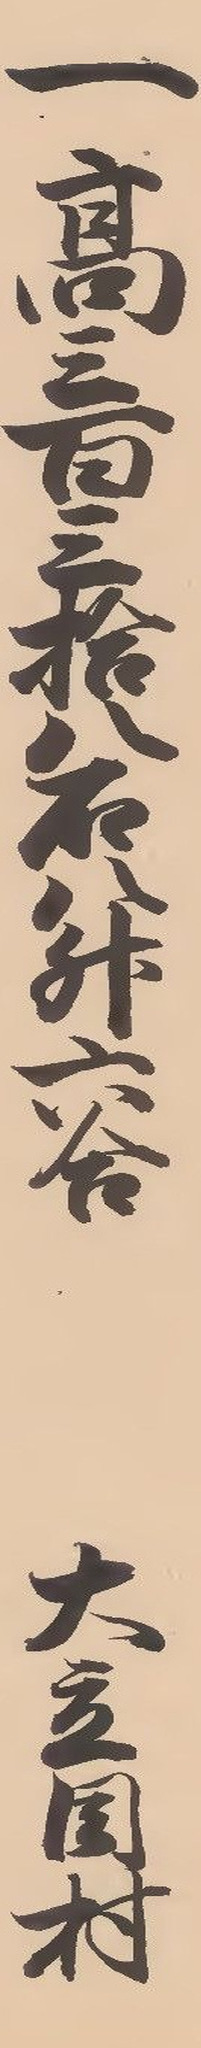一高三百三拾八石八升六合大立目村
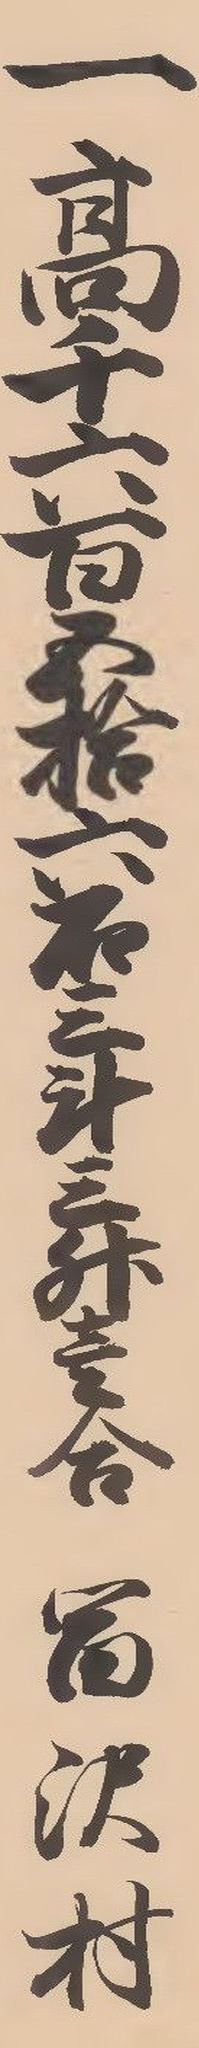一高千六百五拾六石三斗三升壱合富沢村
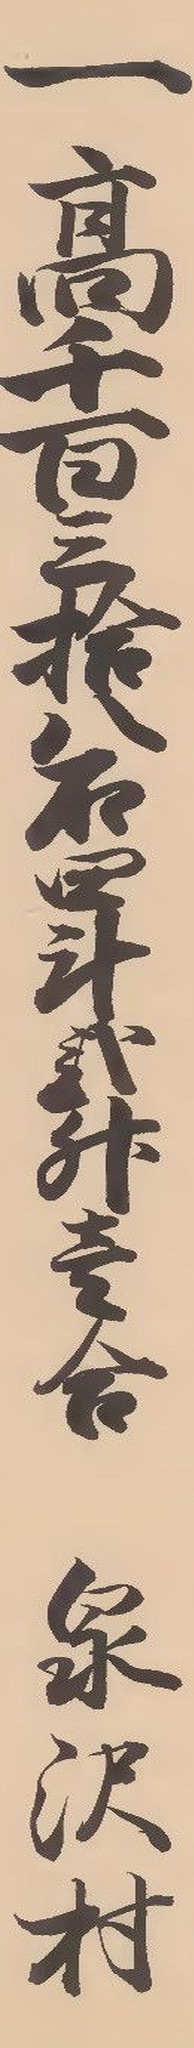一高千百三拾八石四斗弐升壱合泉沢村
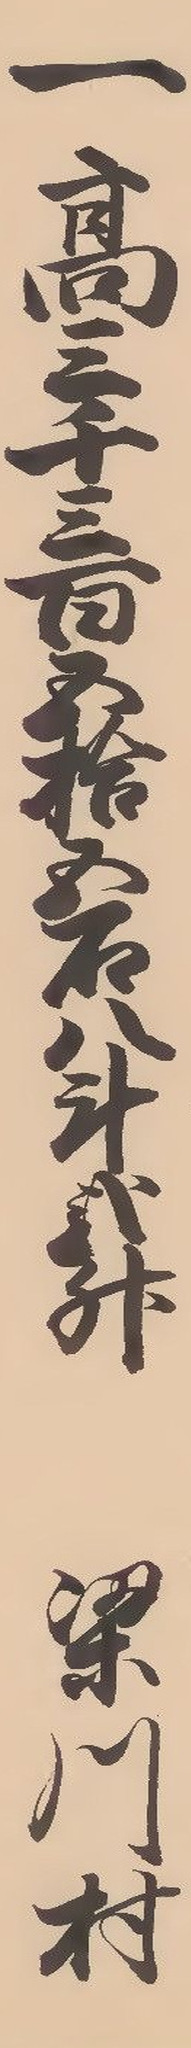一高三千三百五拾五石八斗弐升梁川村

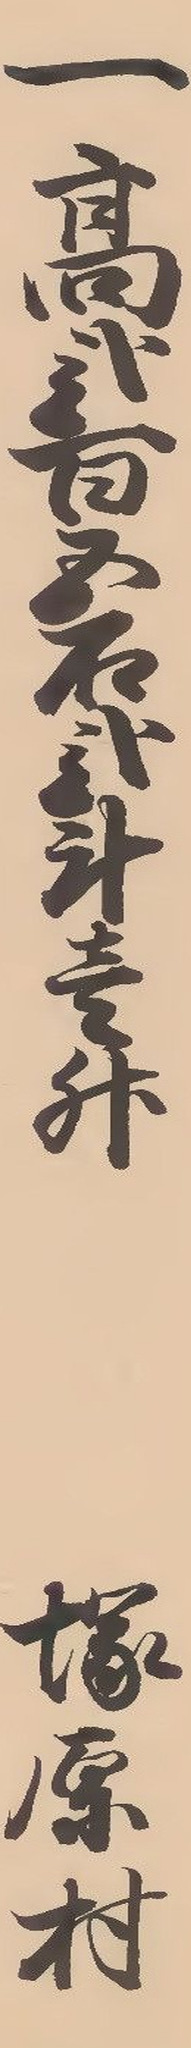一高弐百五石弐斗壱升塚原村
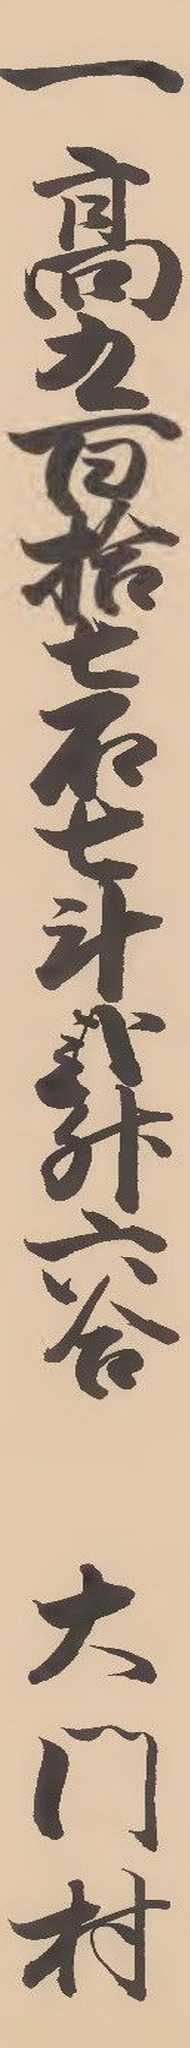一高九百拾七石七斗弐升六合大門村
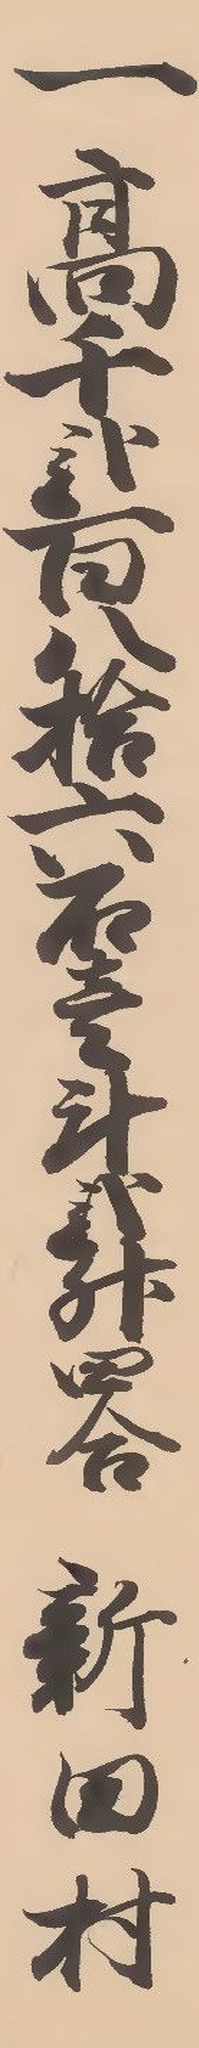一高千弐百八拾六石壱斗弐升四合新田村
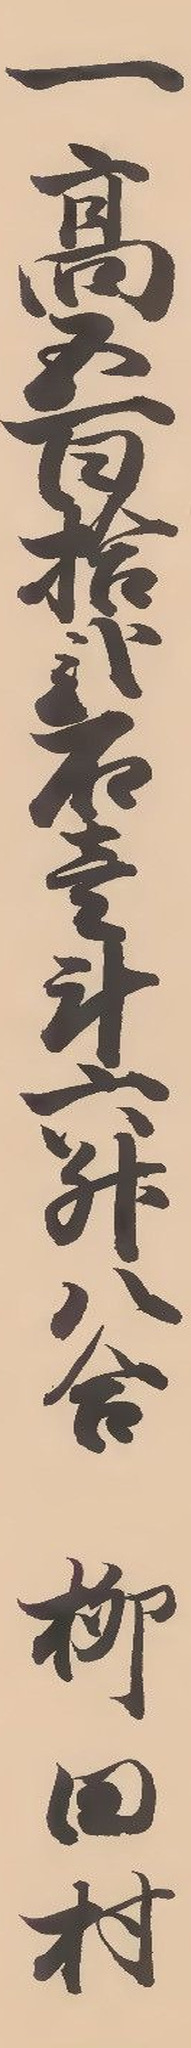一高五百拾弐石壱斗六升八合柳田村
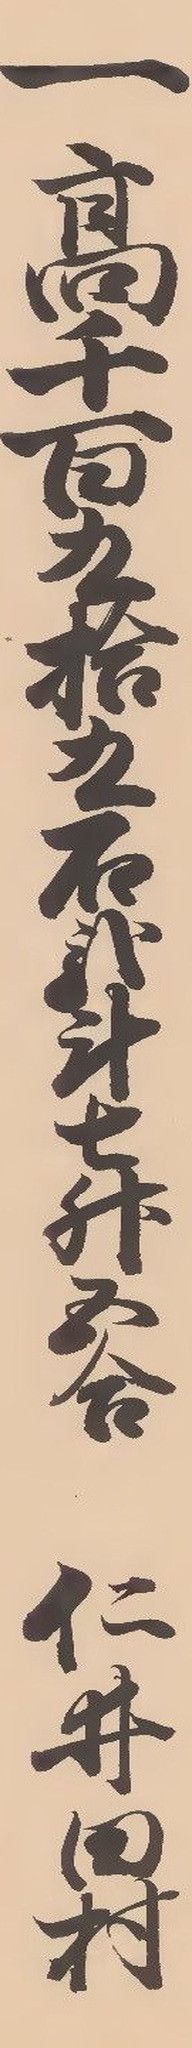一高千百九拾九石弐斗七升五合仁井田村
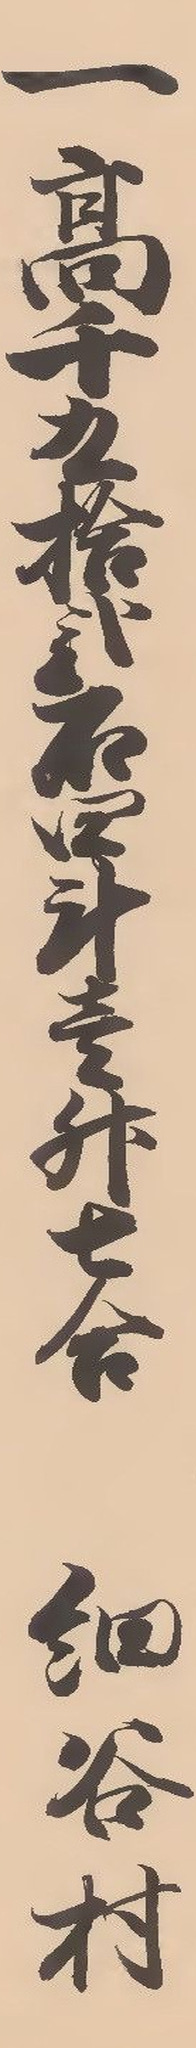一高千九拾弐石四斗壱升七合細谷村
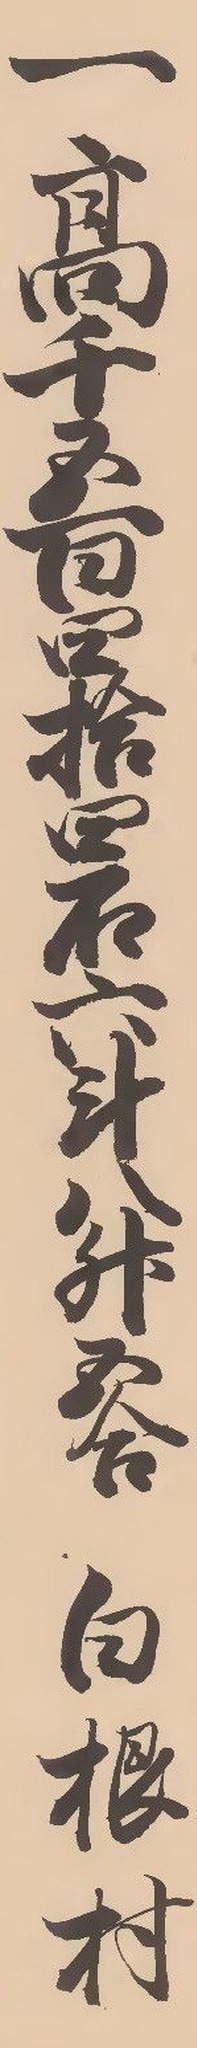一高千五百四拾四石六斗八升五合白根村
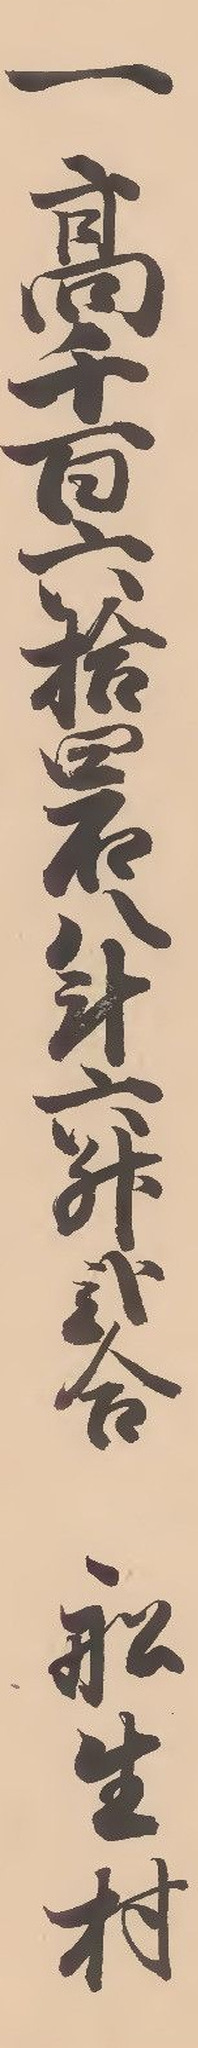一高千百六拾四石八斗六升弐合船生村

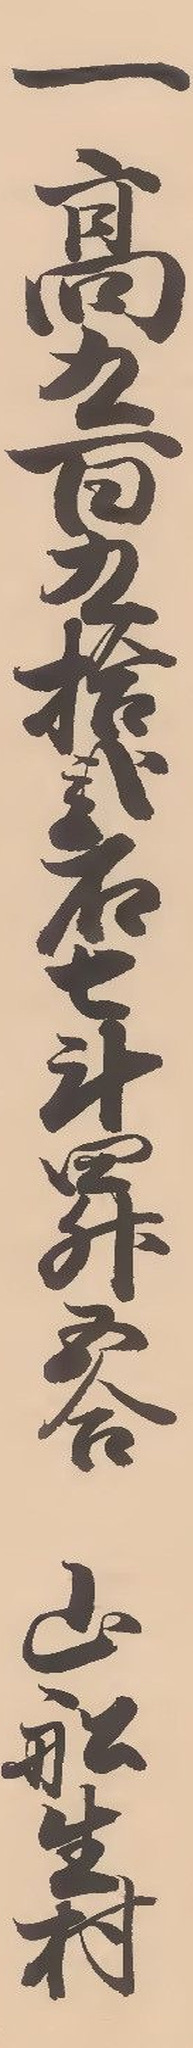一高九百九拾弐石七斗四升五合山船生村
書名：陸奥国郷帳　４
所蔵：国立公文書館 National Archives of Japan
